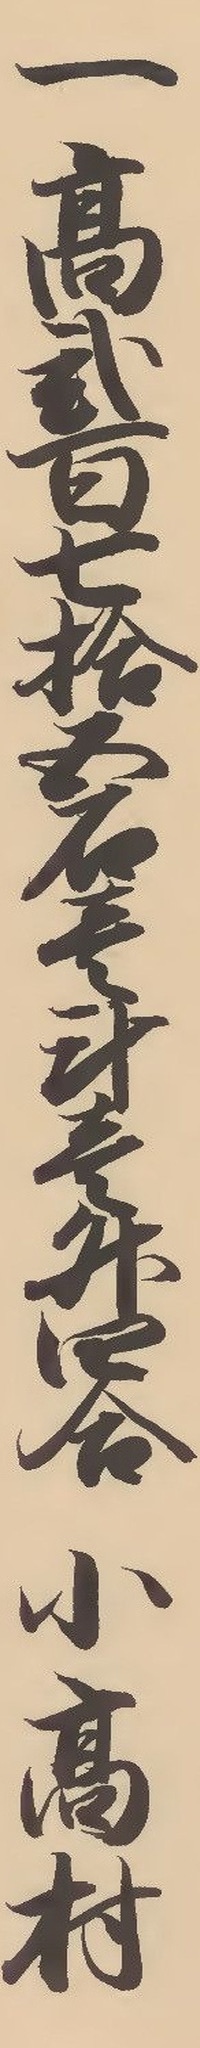一高弐百七拾五石壱斗壱升四合小高村
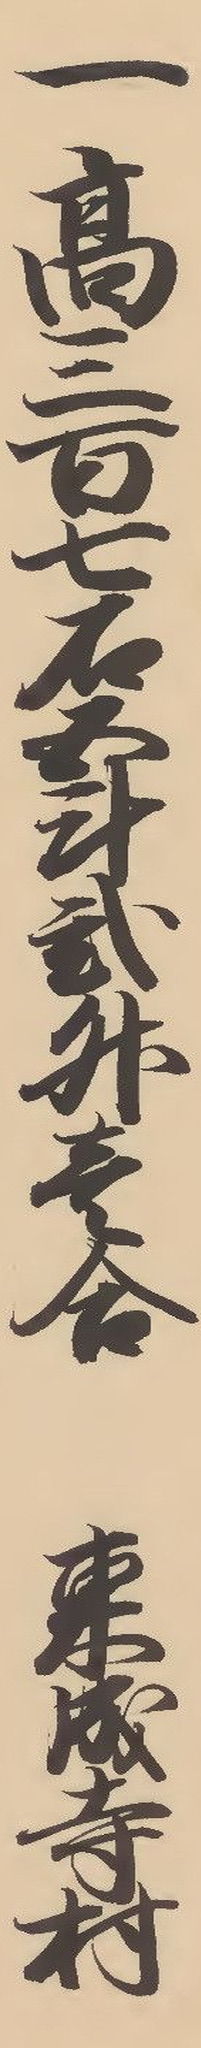一高三百七石五斗弐升壱合東成寺村
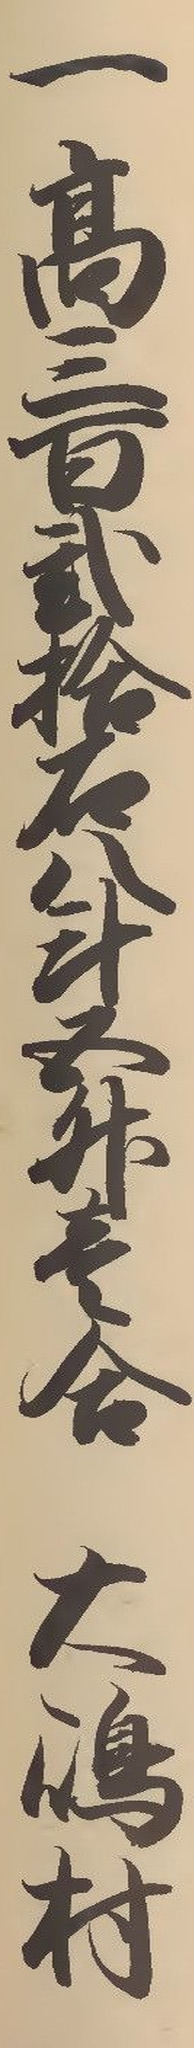一高三百弐拾石八斗五升壱合大島村
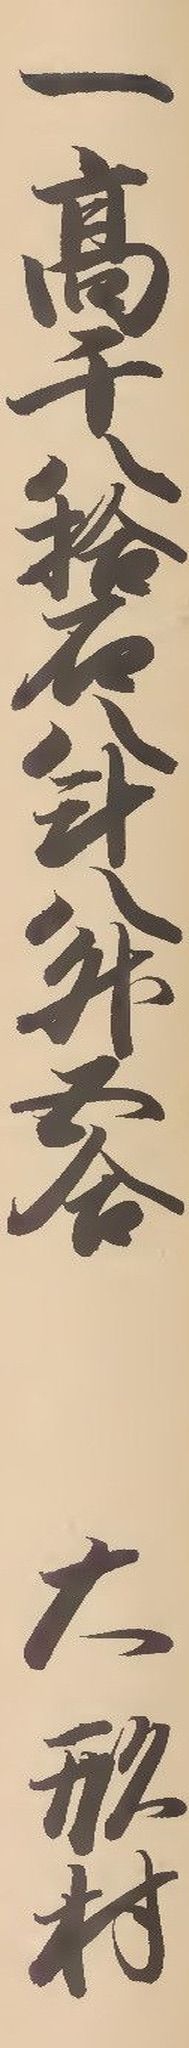一高千八拾石八斗八升五合大形村
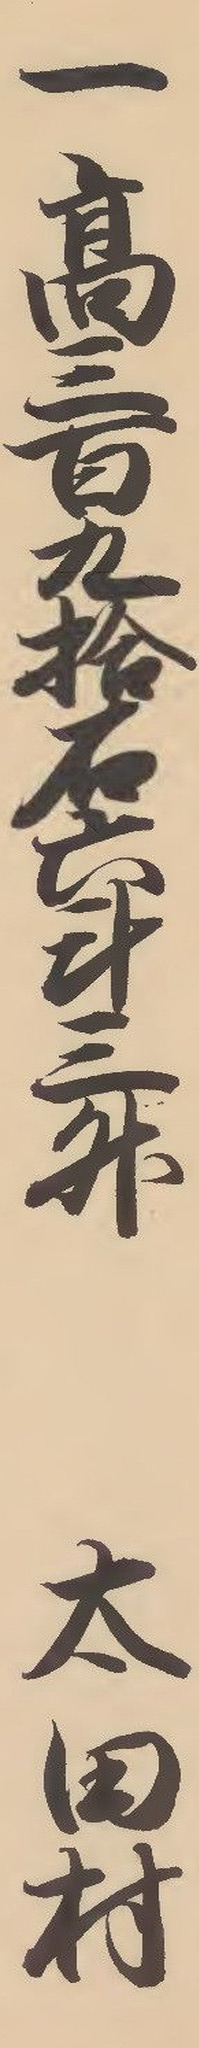一高三百九拾石六斗三升太田村
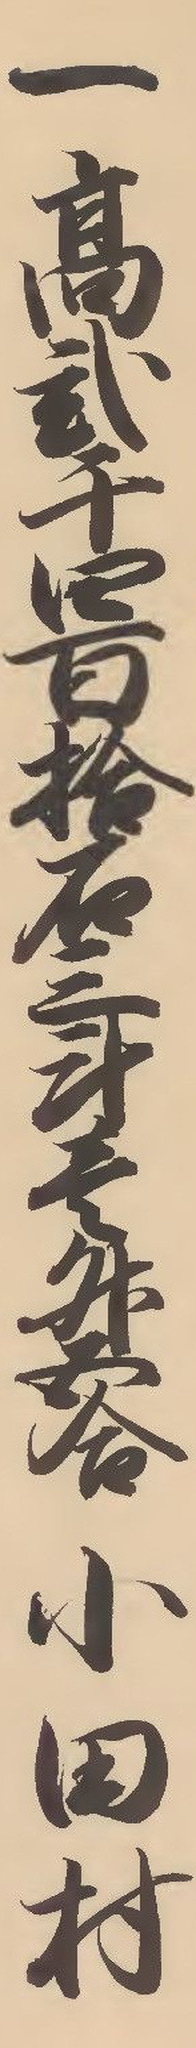一高弐千四百拾石三斗壱升五合小田村
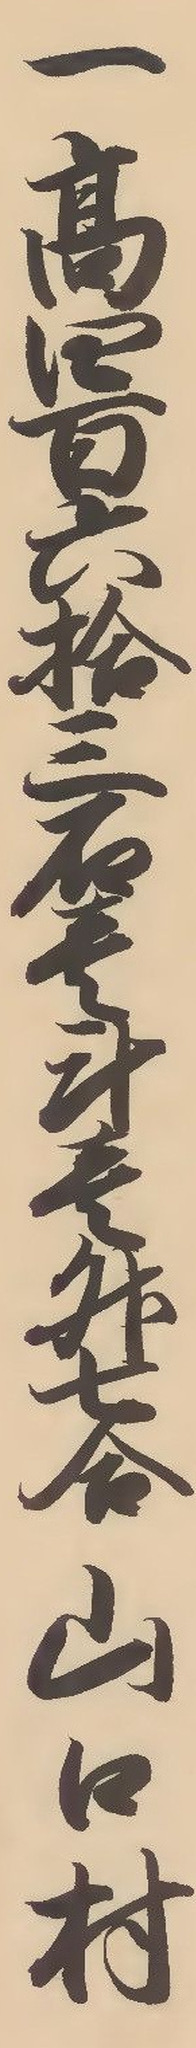一高四百六拾三石壱斗壱升七合山口村

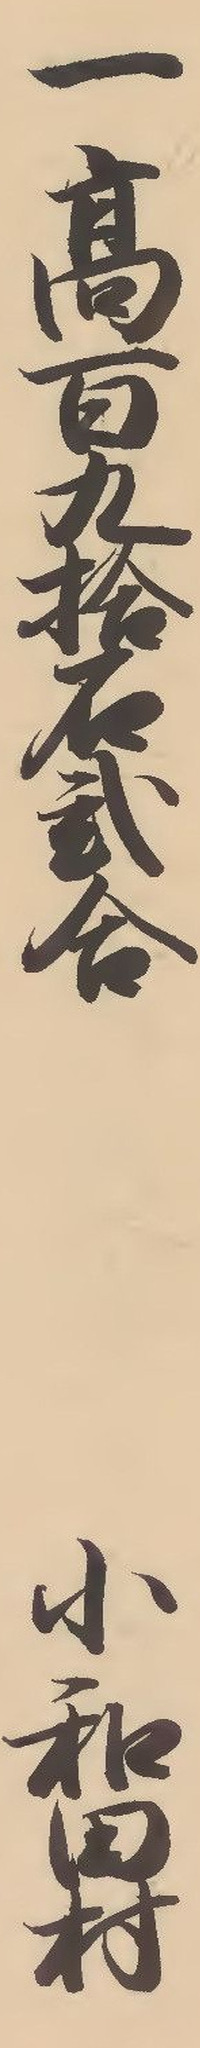一高百九拾石弐合小和田村
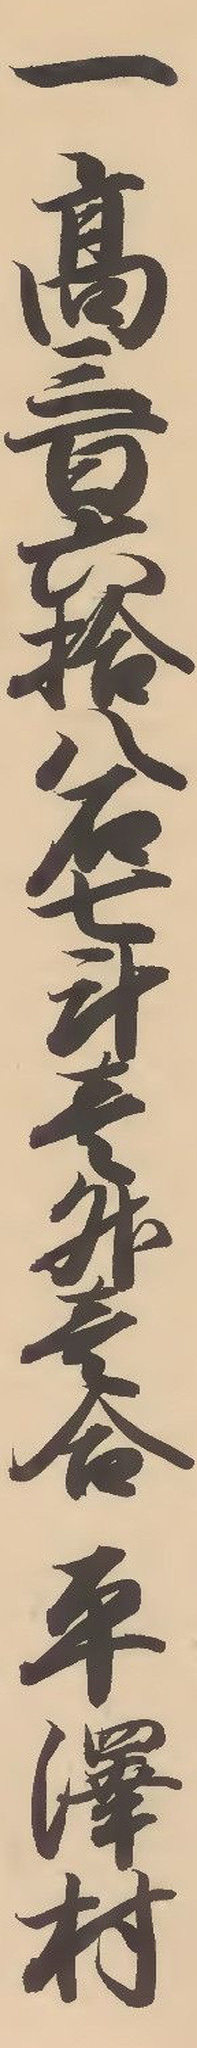一高三百六拾八石七斗壱升壱合平沢村
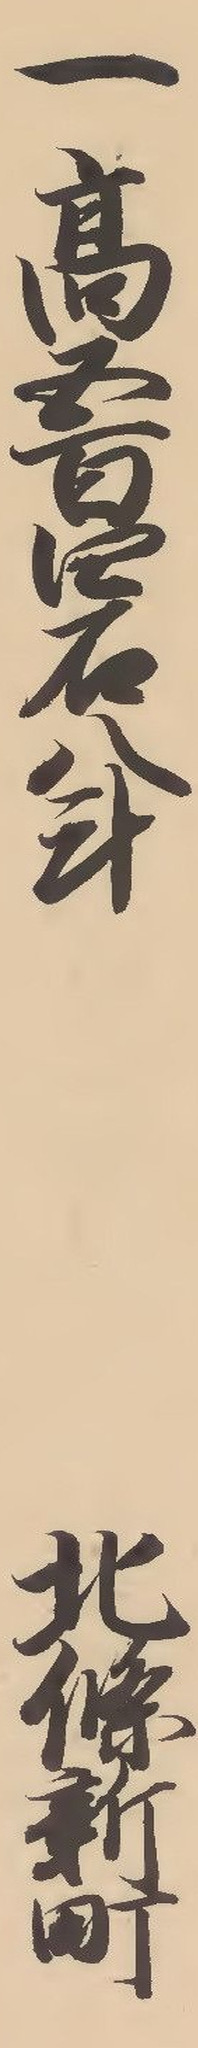一高五百四石八斗北条新町
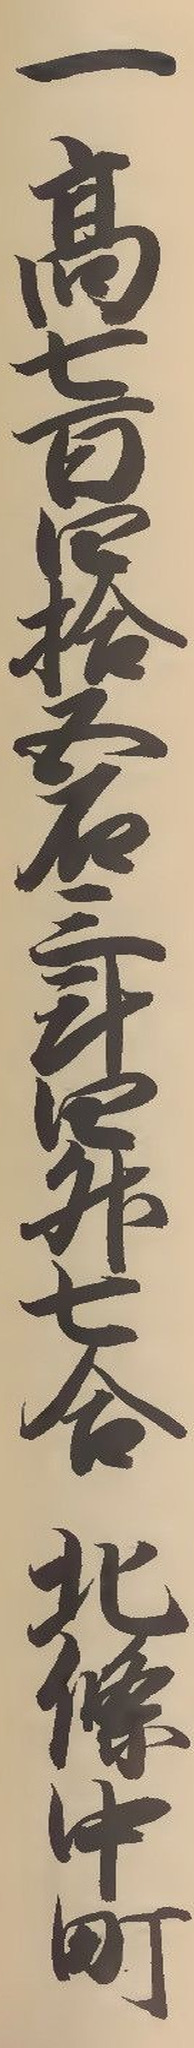一高七百四拾五石三斗四升七合北条中町
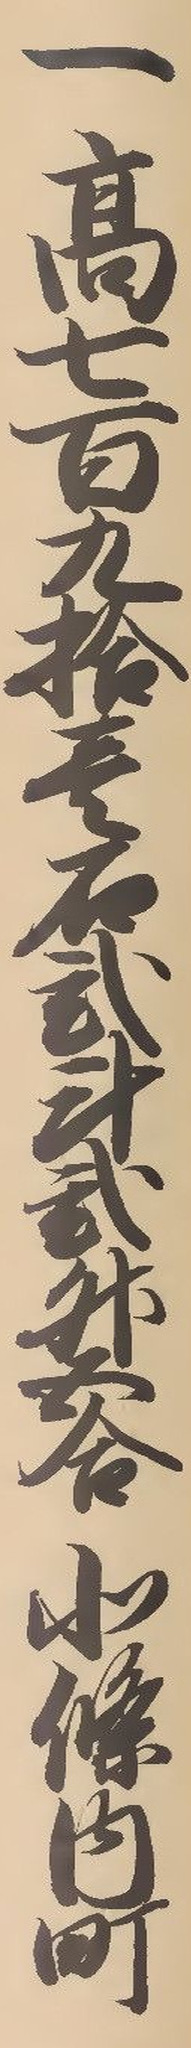一高七百九拾壱石弐斗弐升五合北条内町
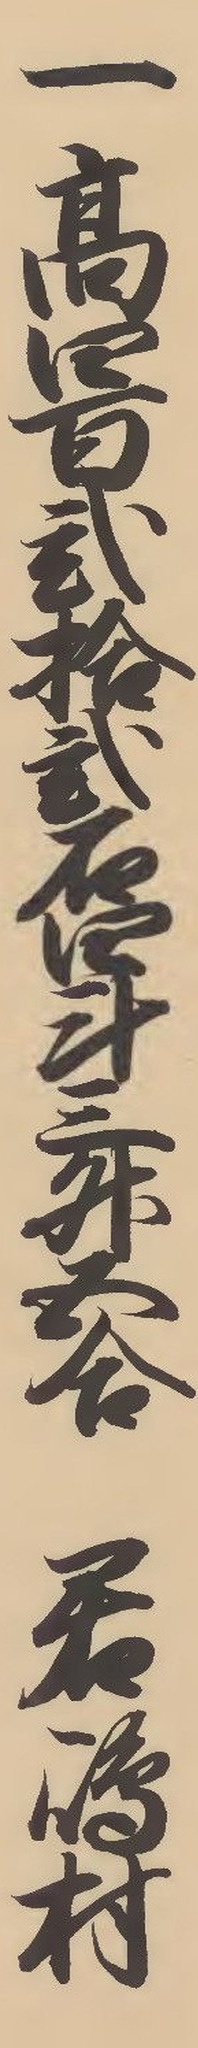一高四百弐拾弐石四斗三升五合君島村
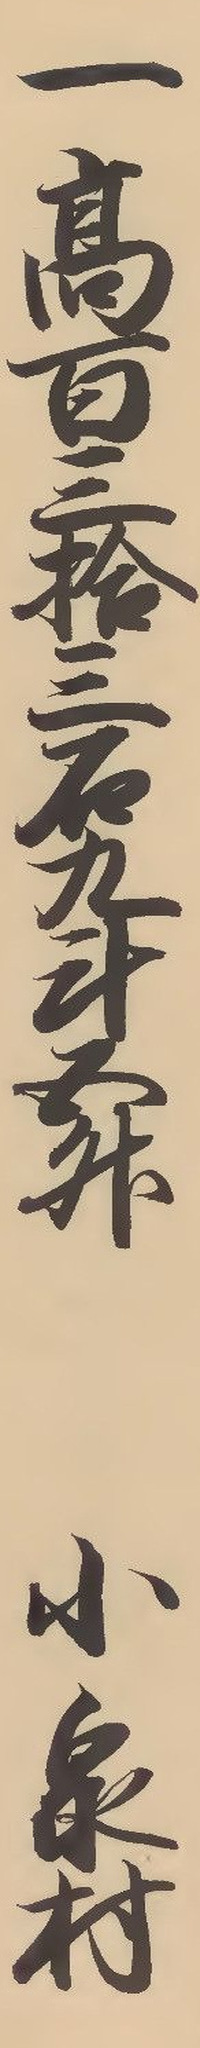一高百三拾三石九斗五升小泉村
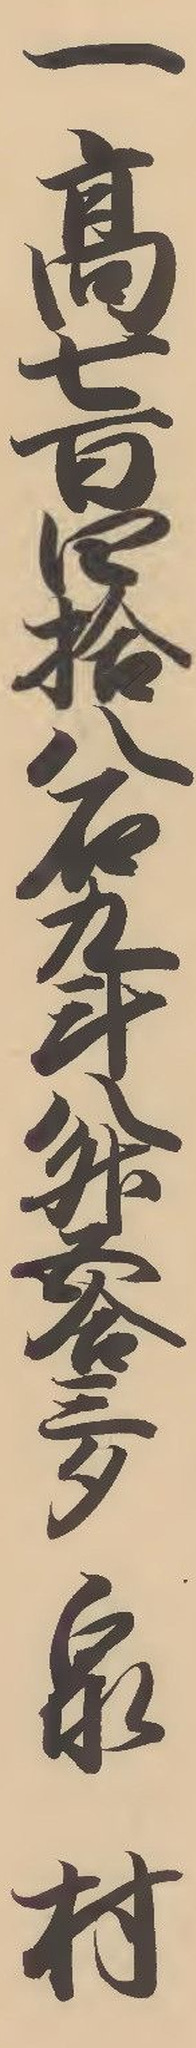一高七百四拾八石九斗八升五合三勺泉村

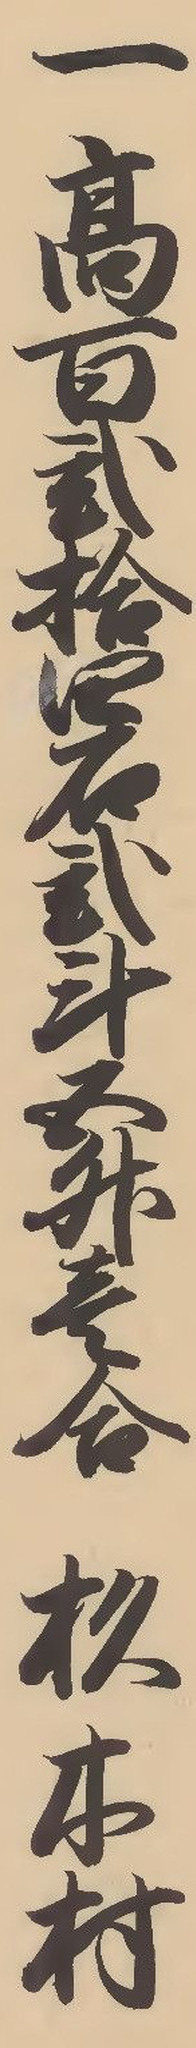一高百弐拾四石弐斗五升壱合杉木村
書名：常陸国郷帳
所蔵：国立公文書館 National Archives of Japan
